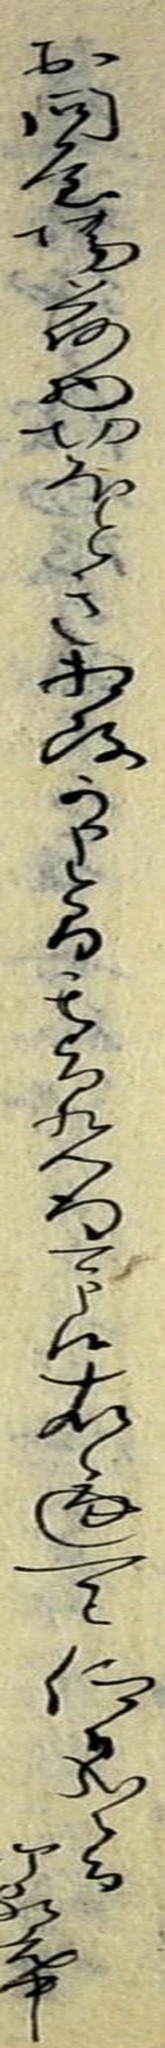於問屋場荷物切ほとき相改可申候間其旨相心得可申候右之通可被仰付哉之旨
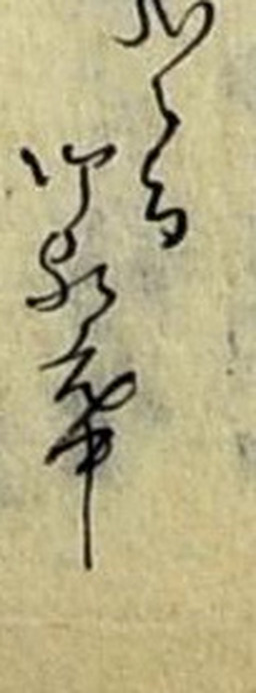御家老中
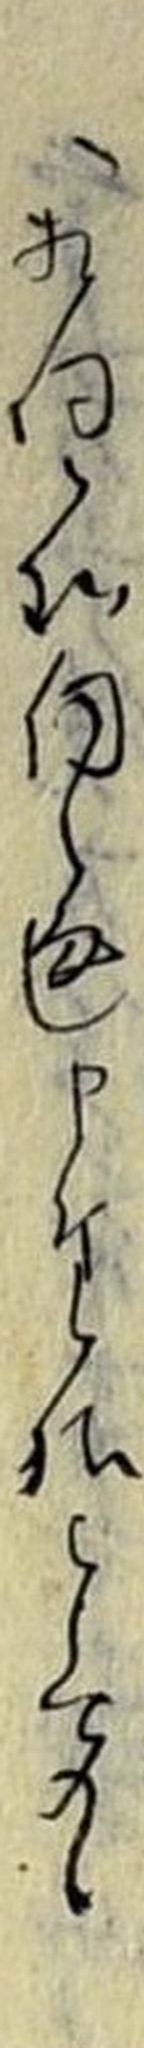へ相伺候処伺之通申付候様被申聞候
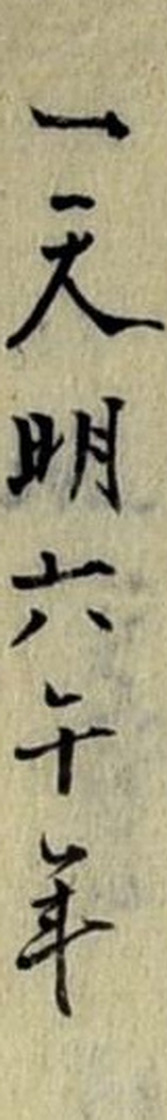一天明六午年
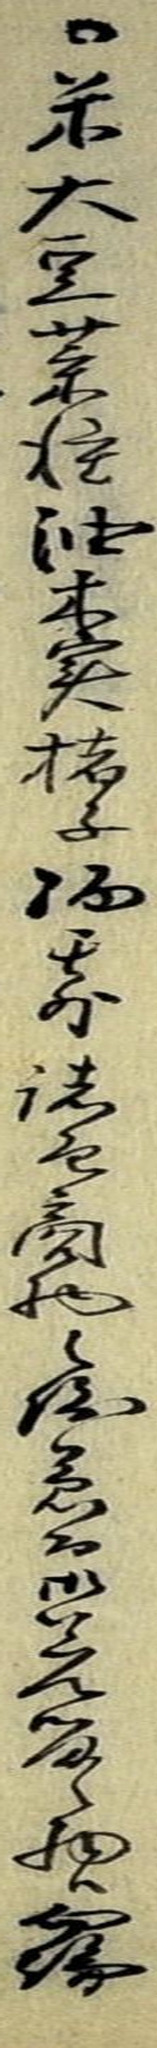〇米大豆菜種油木実楮子酒其外諸色商物之儀兼而差留之物は勿論
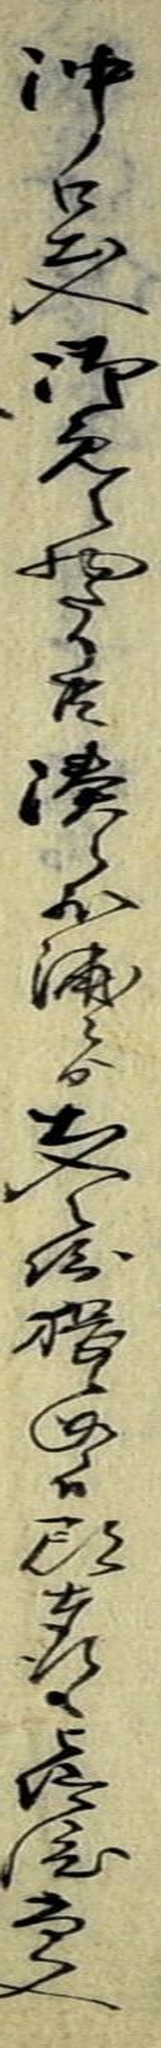沖ノ口出入御免之物たり共湊之外浦々ゟ出入之儀猥候趣に付郡奉行へ被仰渡尚又
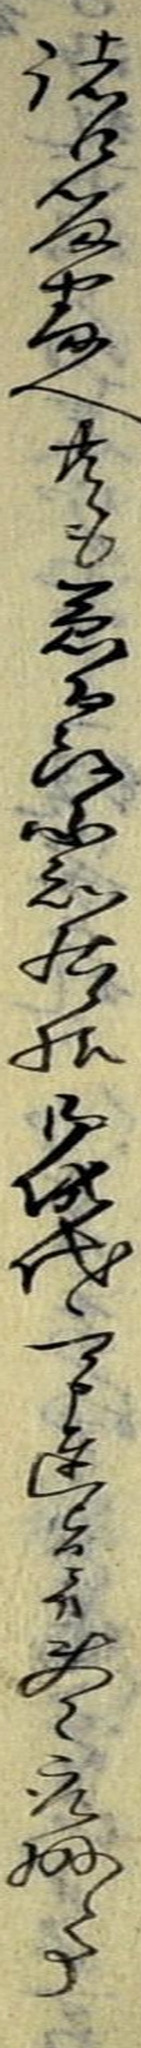諸口留番人共へも兼而致承知居候様御城代へ可申達旨に付夫々取扱候事
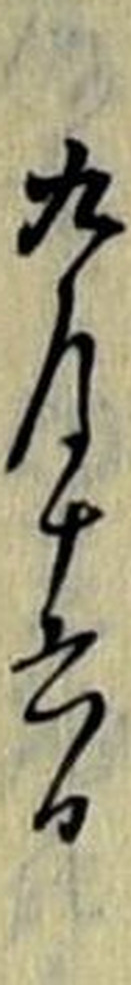九月十六日
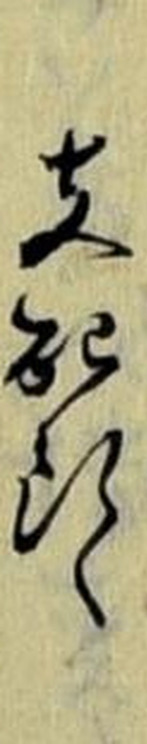支配頭へ
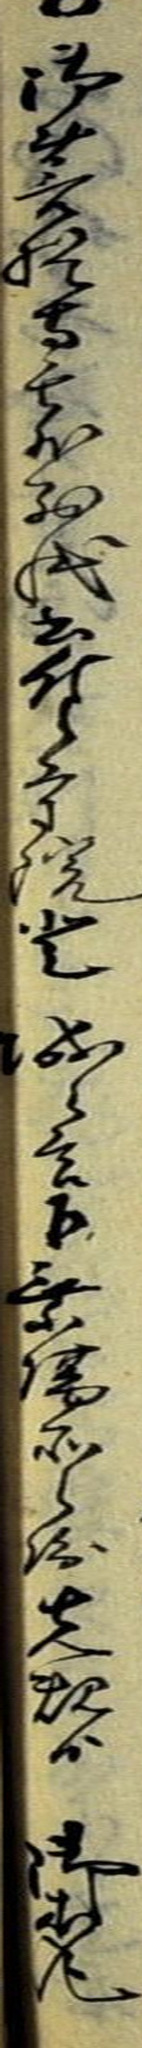〇御菩提寺其外別紙書付之寺院登城之節下乗場所之儀先規ゟ御本丸
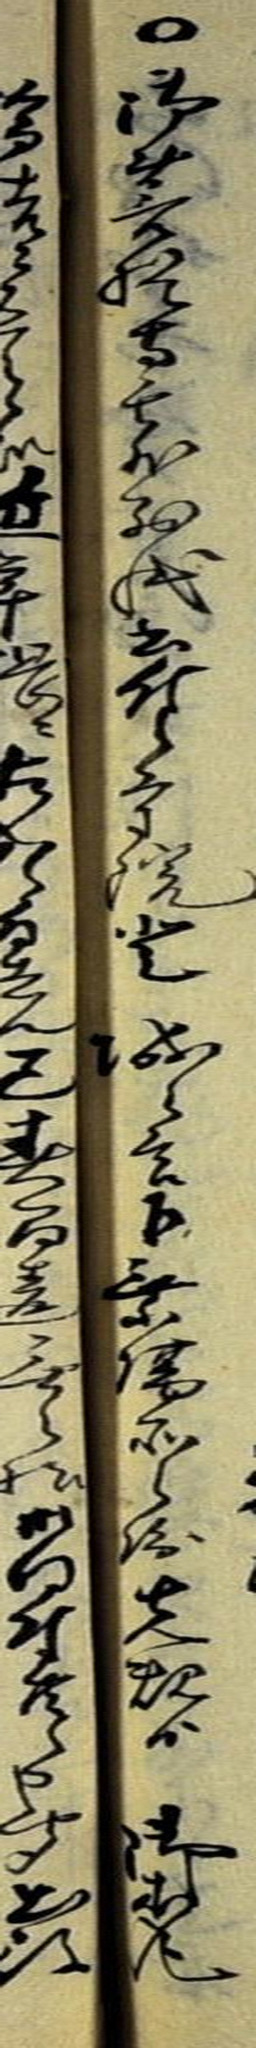橋詰に有之候処近年猥に相成候に付去る巳春間違無之様御目付共へ申聞出役
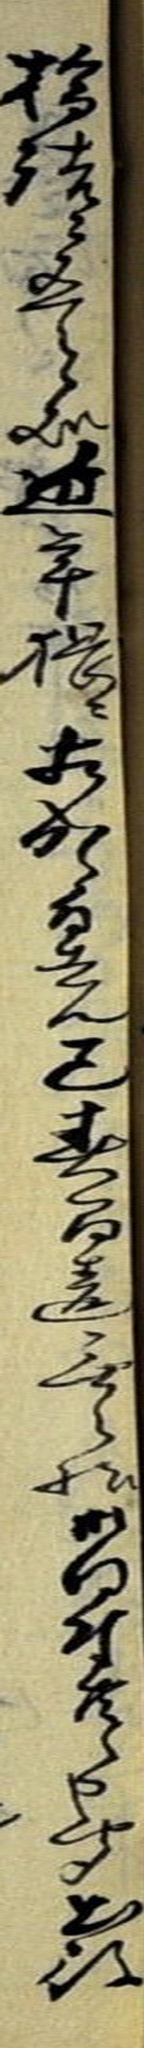橋詰に有之候処近年猥に相成候に付去る巳春間違無之様御目付共へ申聞出役
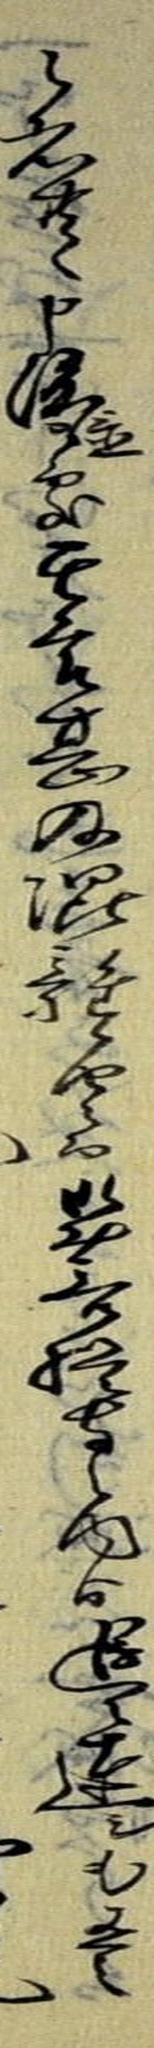之者共へ申渡置候処其節甚及混雑候由に而御菩提寺之内ゟ追々達しも有之
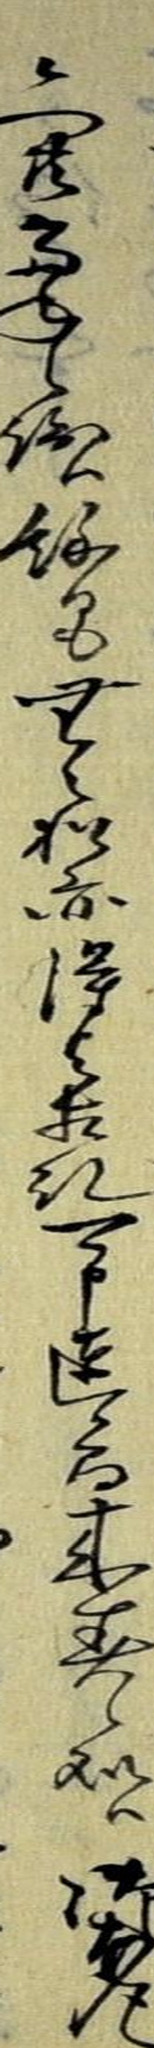候へ共当年之儀は余日も無之猶亦得与相糺可申達候間来春之処は御本丸
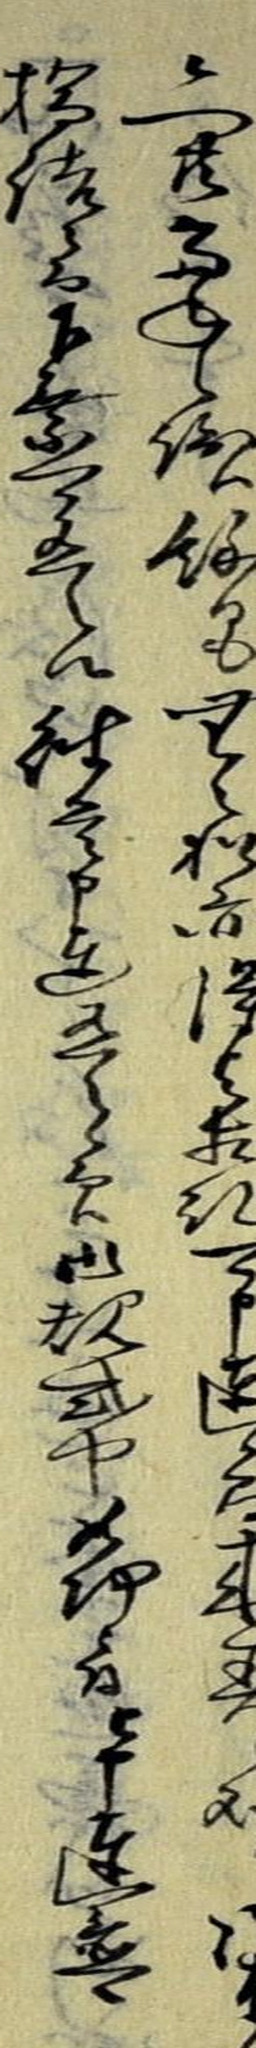橋詰に而下乗可有之候彼是申達有之候而は御規式中如何に付被申達置候
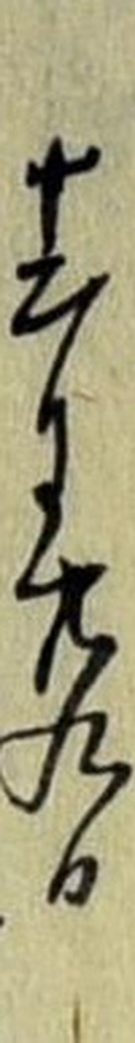十二月廿九日
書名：命令之部 二
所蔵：福井県文書館 Fukui Prefectural Archives
